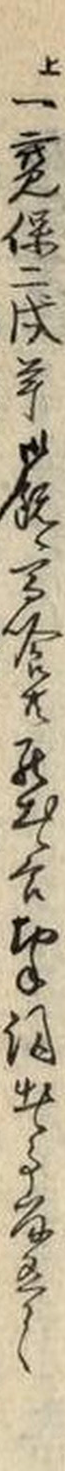上一寛保二戌年御厩へ馬喰共罷出候節切手伺出候事留有之
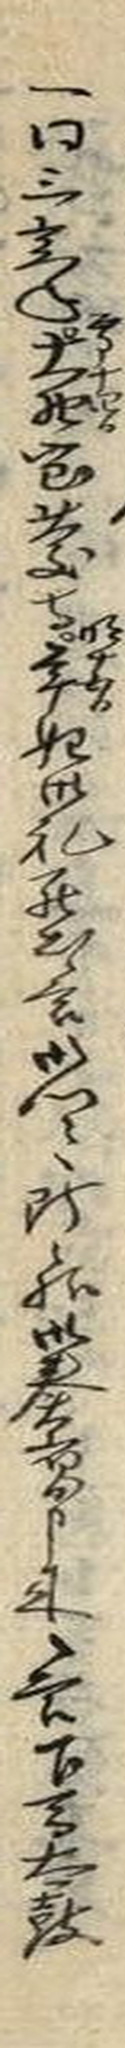一同三亥年正月十四日大野宝慶寺明十五日年始御礼罷出候節御門々へ断候様御奏者ゟ申来候節下馬太鼓
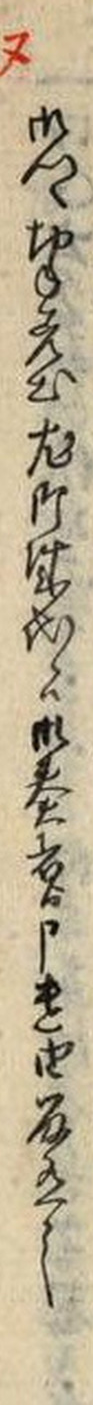御門へ切手差出尤御城代へは御奏者ゟ申遣由留有之

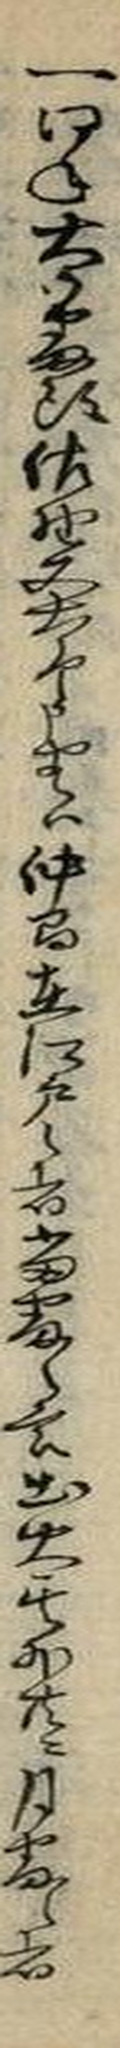一同年大御番頭佐野又太郎申聞候は仲間在江戸之者当番之節出火其外共に月番之者
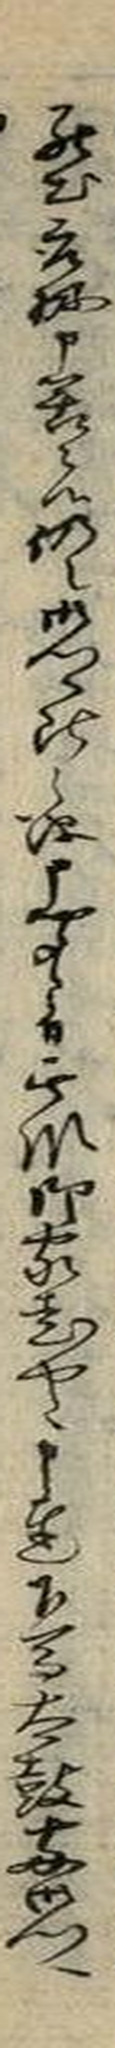罷出取扱申筈に候仍之御門へ断之儀申聞候に付其段御家老中へ申達下馬太鼓両御門へ
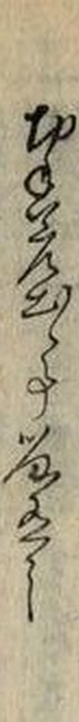切手差出候事留有之
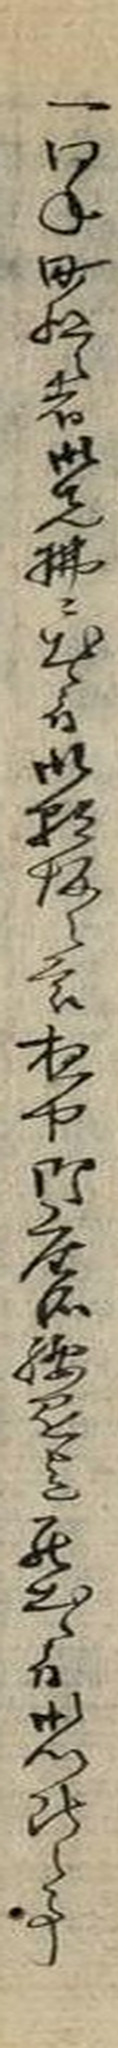一同年町組之者御先払に出候に付御朝坂之節夜中御座所腰掛迄罷出候に付御門断之事
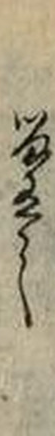留有之
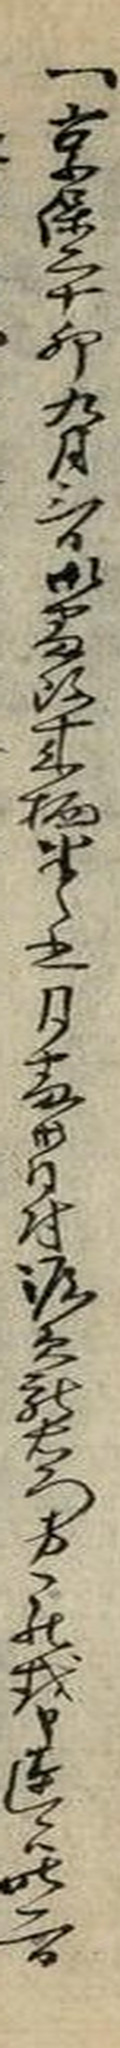一享保二十卯九月三日御番改来栖半之丞月番御目付渥美新右衛門方へ罷越申達候は昨二日
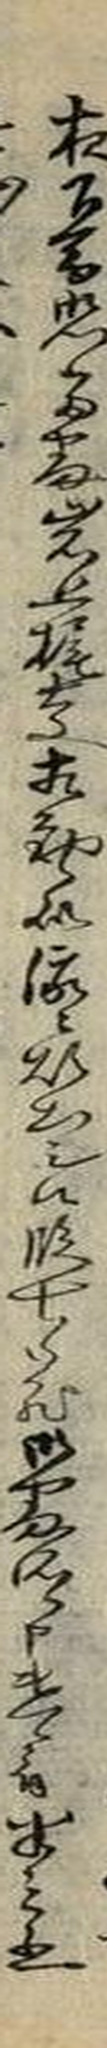夜下馬御門当番岩上梶太夫相勤候処俄に煩出し候段七ツ蔵御番所へ申遣候に付半之丞
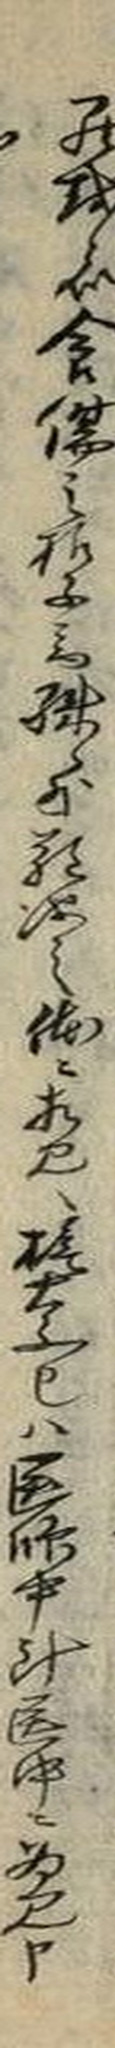罷越候処食傷之様子に而殊之外難儀之体に相見候梶太夫申候は医師中針医師に為見申
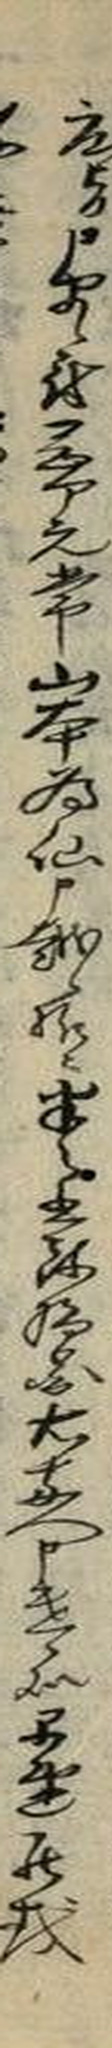度旨申聞候に付岡部元常山本為仙申越候様に半之丞致指図右両人申遣候処早速罷越
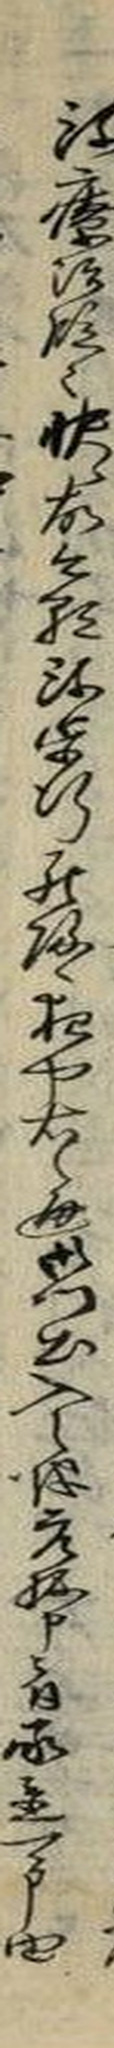致療治段々快候故今朝致歩行罷帰候夜中右之通御門出入之儀取扱申に付承置可申由
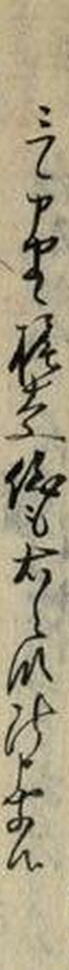にて申聞候梶太夫儀も右之段断申聞候
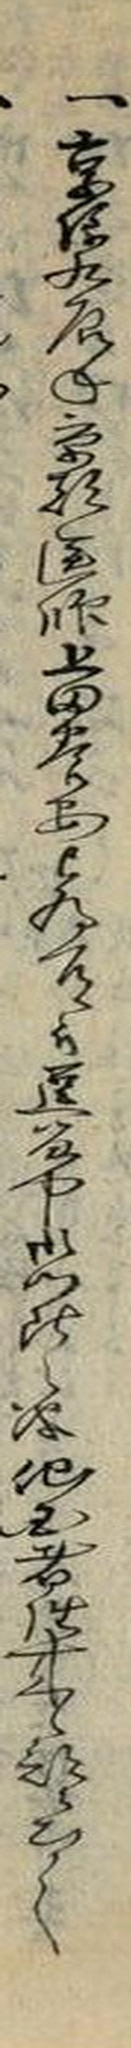一享保九辰年京都医師上田屋養安被為召候に付逗留中御門断之儀他国者往来之部に出之
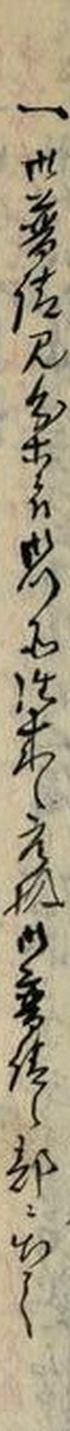一御普請見分等に付御門所往来之取扱御普請之部に出之
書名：御門御櫓之部
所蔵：福井県文書館 Fukui Prefectural Archives
